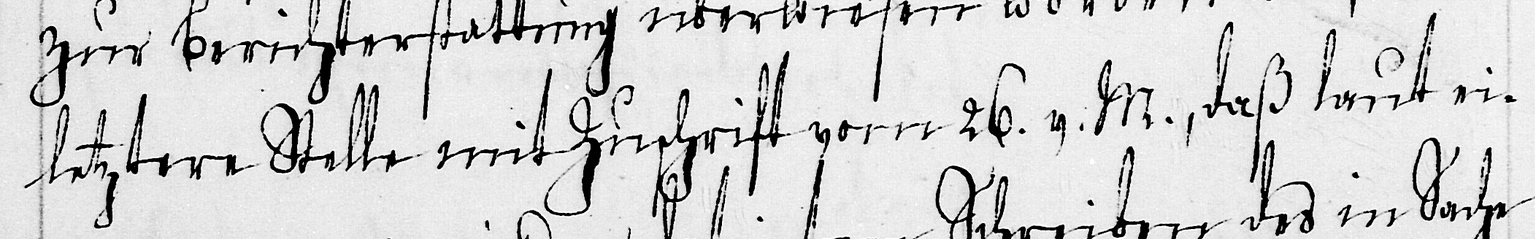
letztere Stelle mit Zuschrift vom 26. v. M., daß laut ei¬
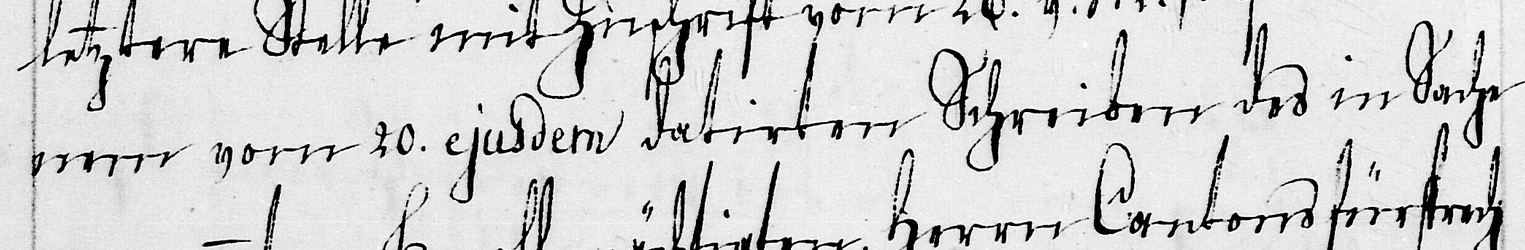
nem vom 20. ejusdem datirten Schreiben des in Sache
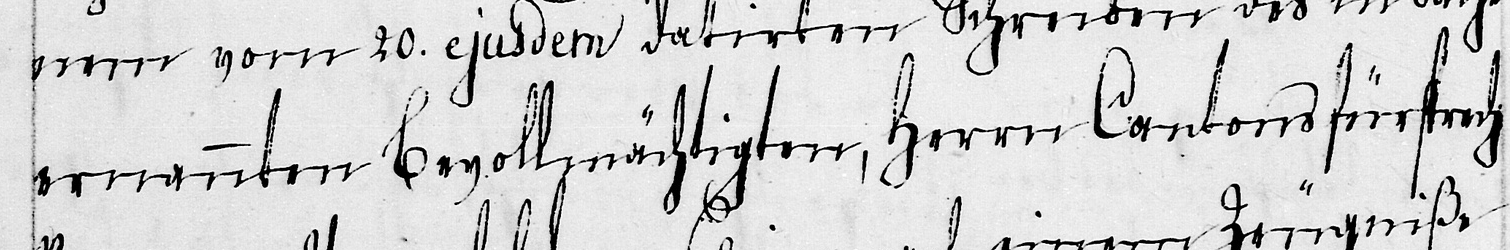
ernannten Bevollmächtigten, Herrn Cantonsfürspr¬
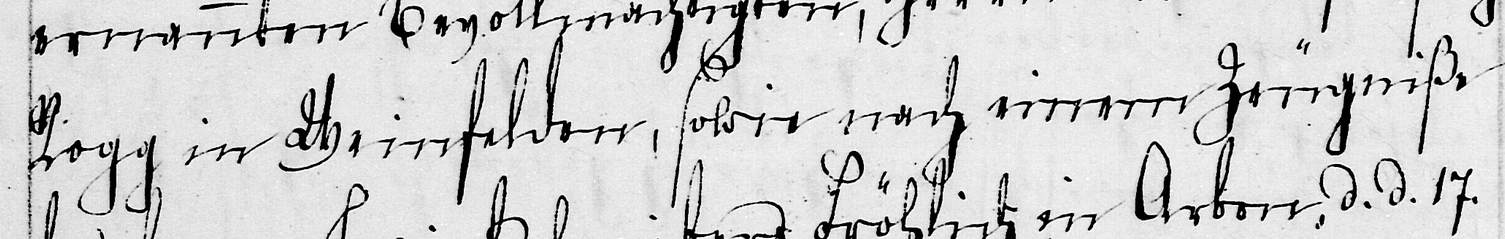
Rogg in Weinfelden, sowie nach einem Zeugniße
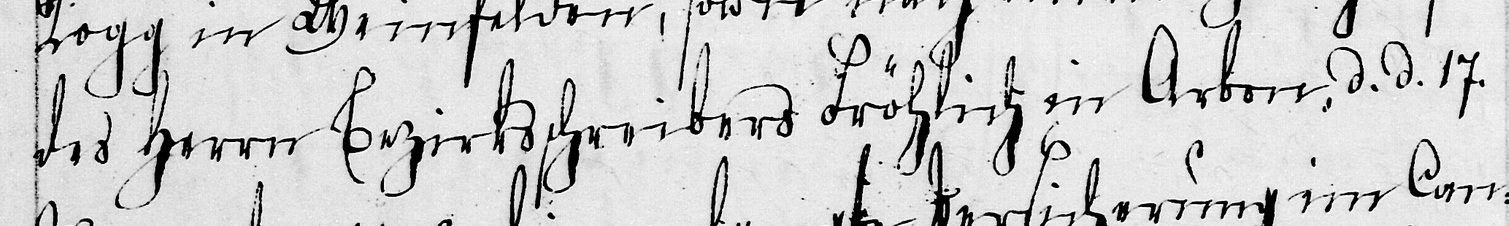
des Herrn Bezirksschreibers Fröhlich in Arbon, d. d.
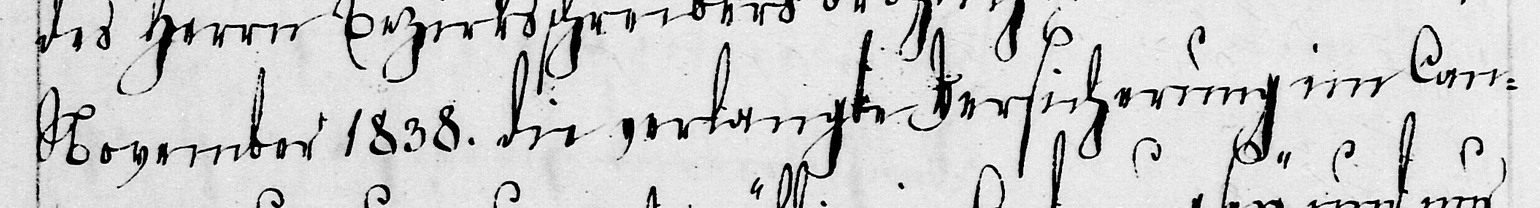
November 1838. die verlangte Versicherung im Can¬
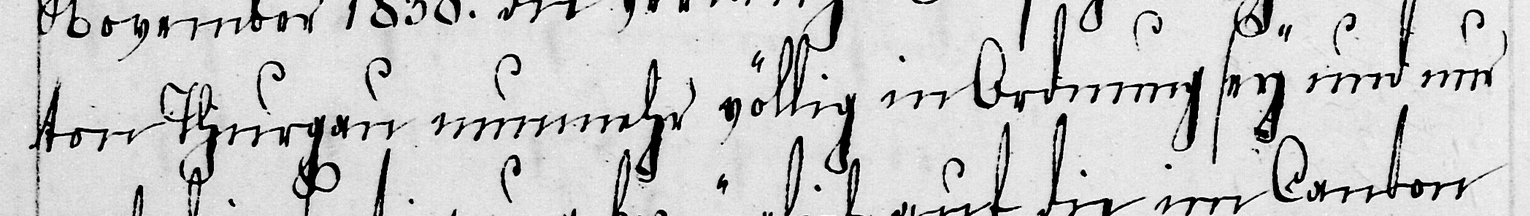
ton Thurgau nunmehr völlig in Ordnung sey und nur
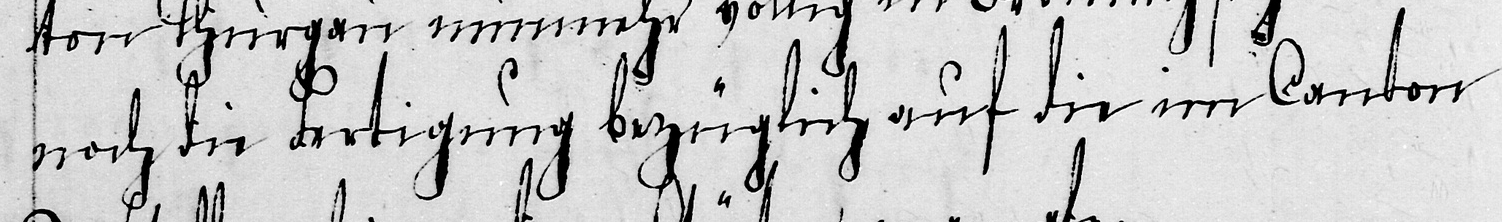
noch die Fertigung bezüglich auf die im Canton
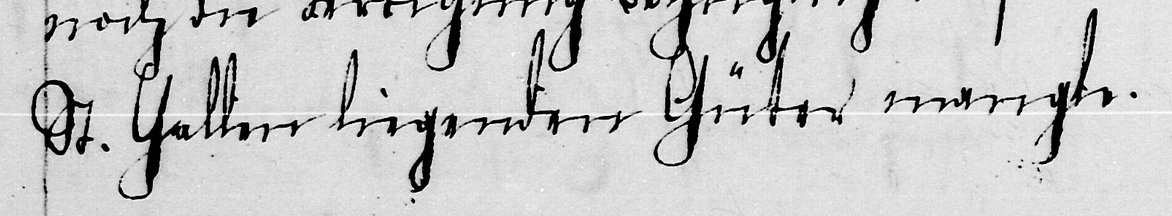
St. Gallen liegenden Güter mangle.
